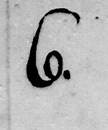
50.
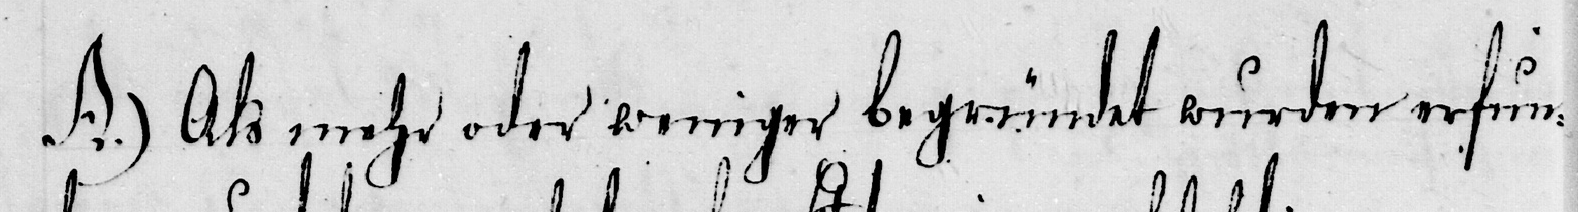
A.) Als mehr oder weniger begründet wurden erfun¬
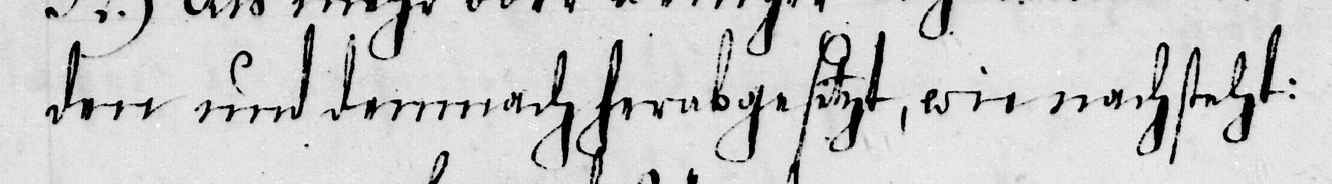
den und demnach herabgesetzt, wie nachsteht:
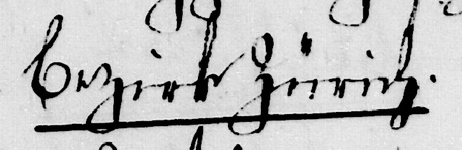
Bezirk Zürich.
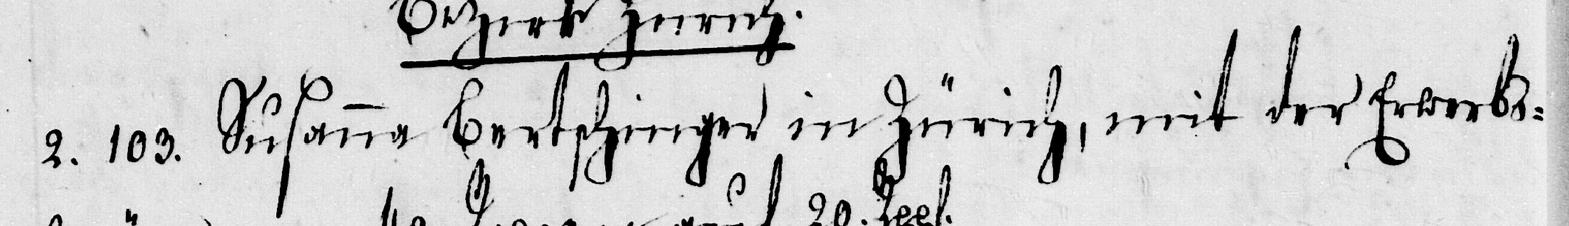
2. 103. Susanna Bertschinger in Zürich, mit der Erwerbs¬
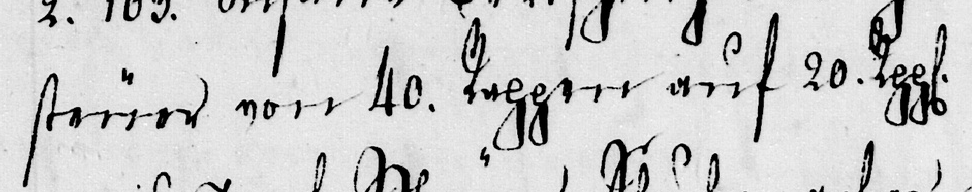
steuer von 40. Rappen auf 20. Rp¬
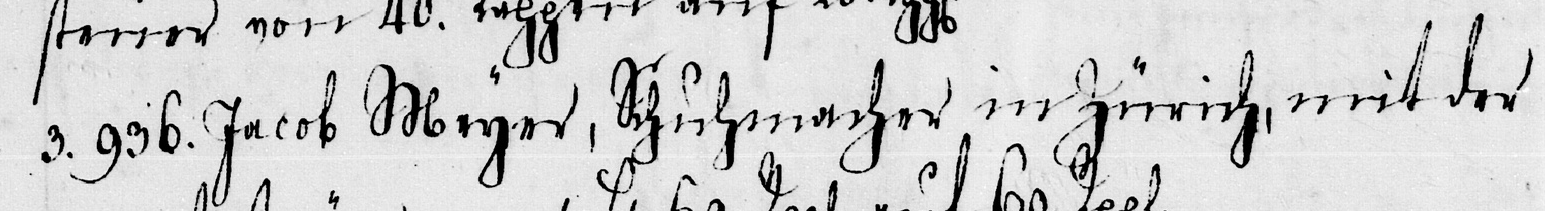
3. 936. Jacob Meyer, Schuhmacher in Zürich, mit der
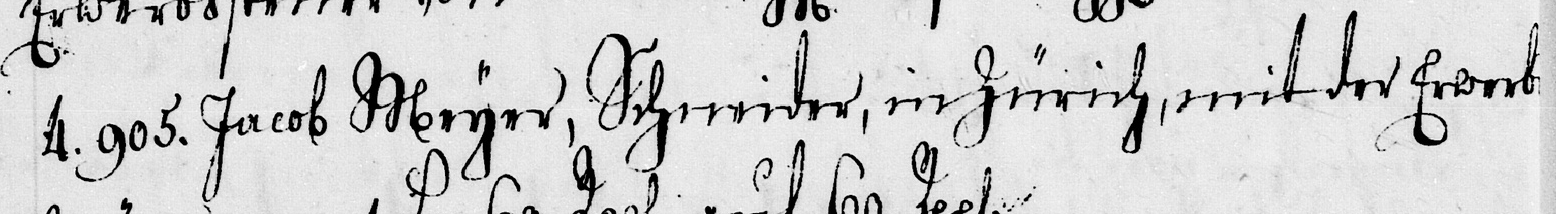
4. 905. Jacob Meyer, Schneider, in Zürich, mit der Erwer¬
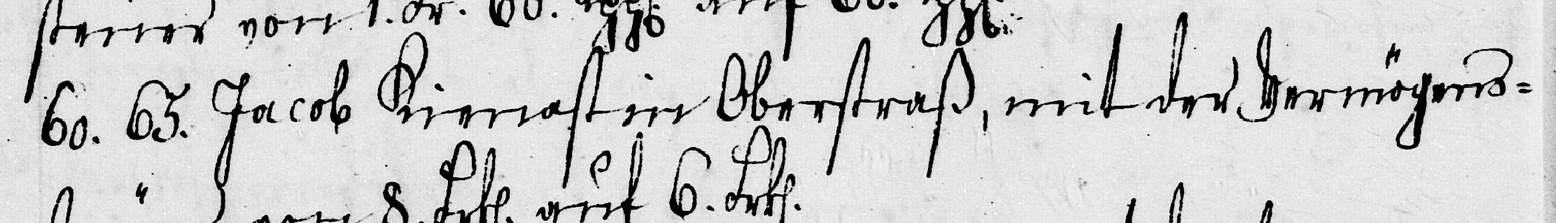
60. 65. Jacob Kienast in Oberstraß, mit der Vermögens¬
